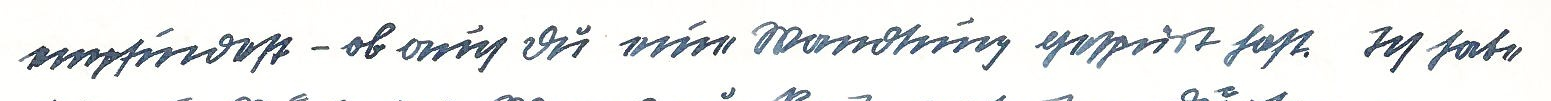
empfindest – ob auch Du eine Wandlung gespürt hast. Ich habe
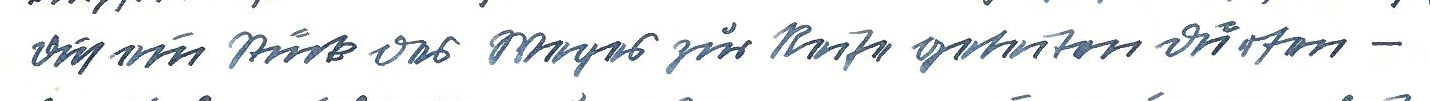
Dich ein Stück des Weges zur Reife geleiten dürfen —
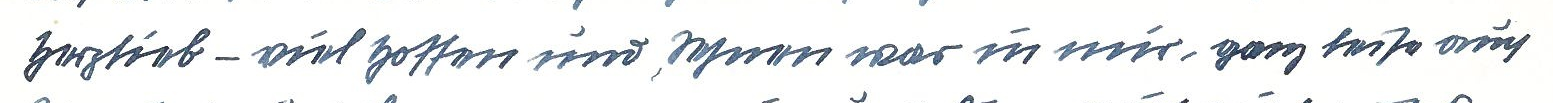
Herzlieb — viel Hoffen und Sehnen war in mir, ganz leise auch
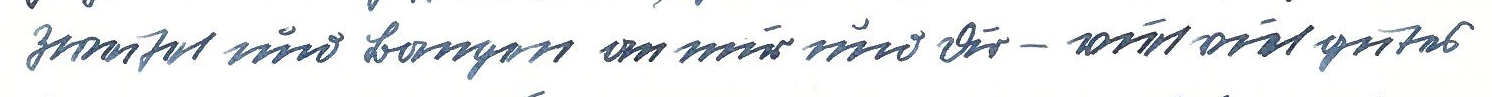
Zweifel und Bangen an mir und Dir – viel viel gutes
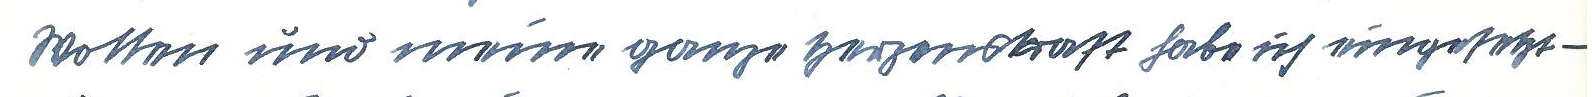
Wollen und meine ganze Herzenskraft habe ich eingesetzt —
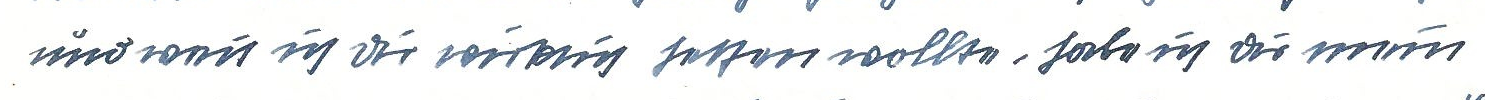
und weil ich Dir wirklich helfen wollte, habe ich Dir mein
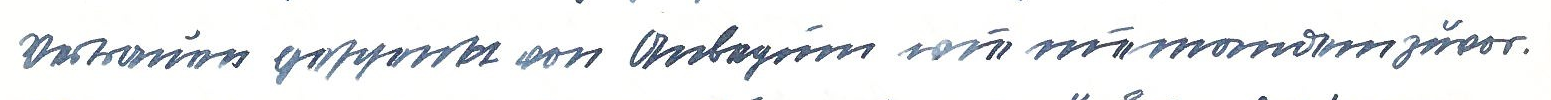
Vertrauen geschenkt von Anbeginn wie niemandem zuvor.
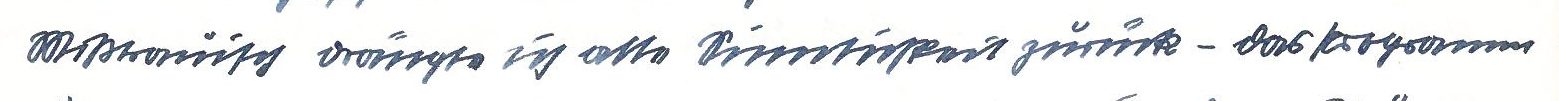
Mißtrauisch drängte ich alle Sinnlichkeit zurück – das Programm
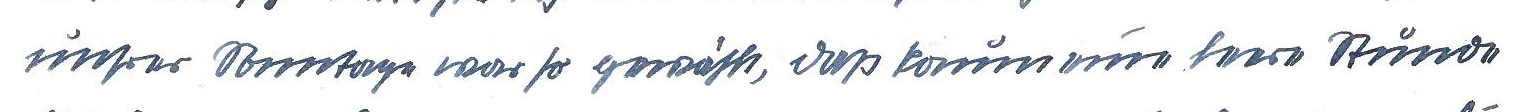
unsrer Sonntage war so gewählt, daß kaum eine leere Stunde
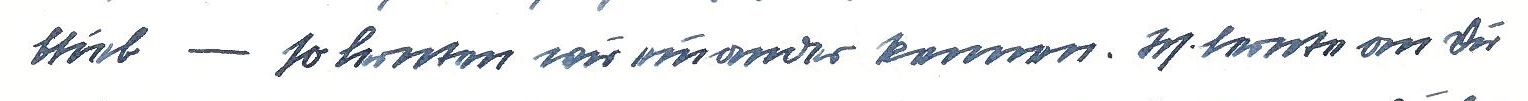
blieb — so lernten wir einander kennen. Ich lernte an Dir
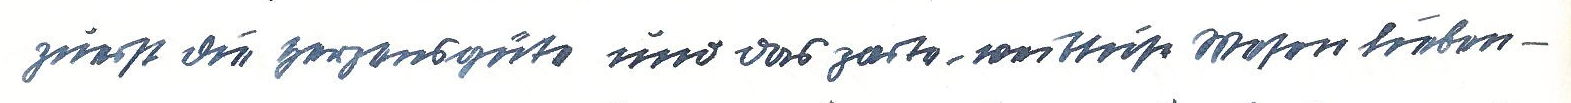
zuerst die Herzensgüte und das zarte, weibliche Wesen lieben –
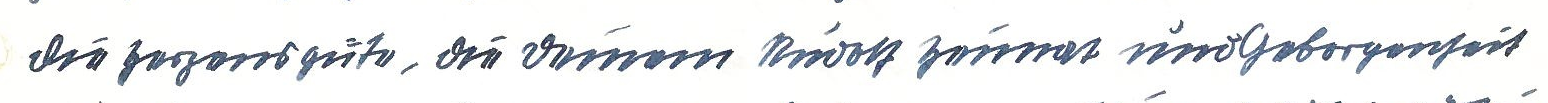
die Herzensgüte, die Deinem Heimat und Geborgenheit
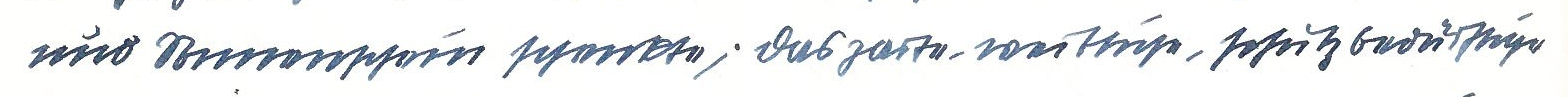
und Sonnenschein schenkte; das zarte, weibliche, schutzbedürftige
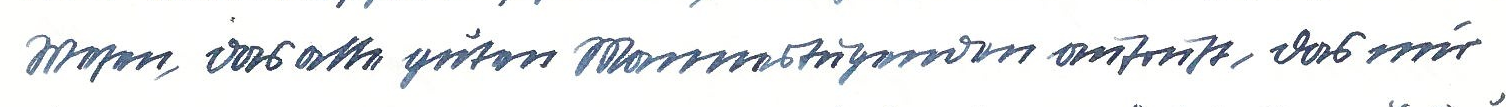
Wesen, das alle guten Mannestugenden aufruft, das mir
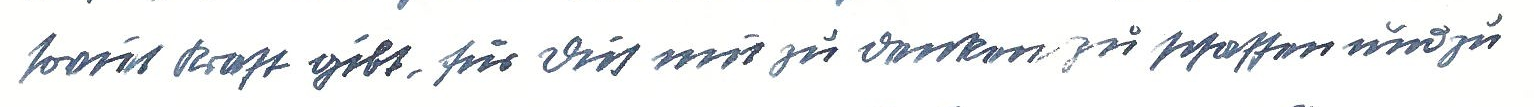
soviel Kraft gibt, für Dich mit zu denken, zu schaffen und zu
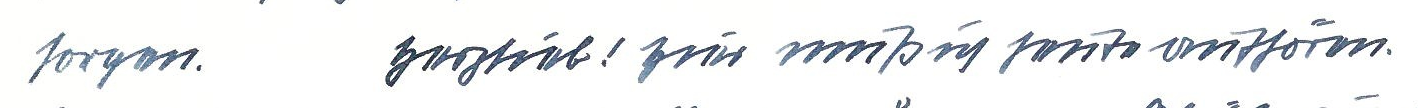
sorgen. Herzlieb! Hier muß ich heute aufhören.
